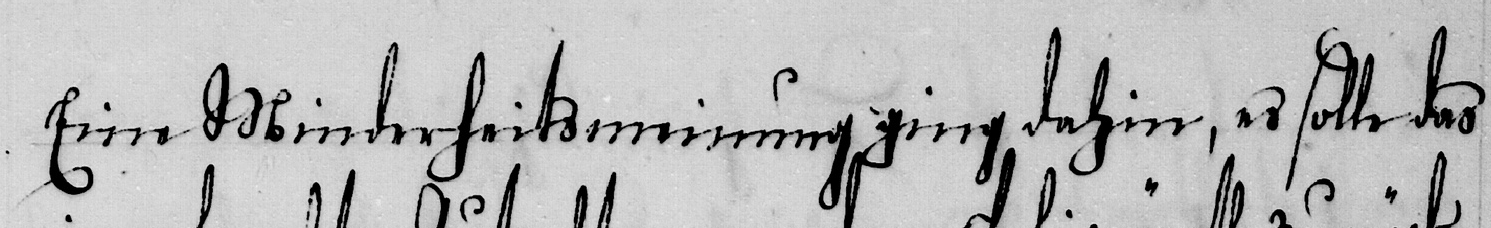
Eine Minderheitsmeinung ging dahin, es solle das
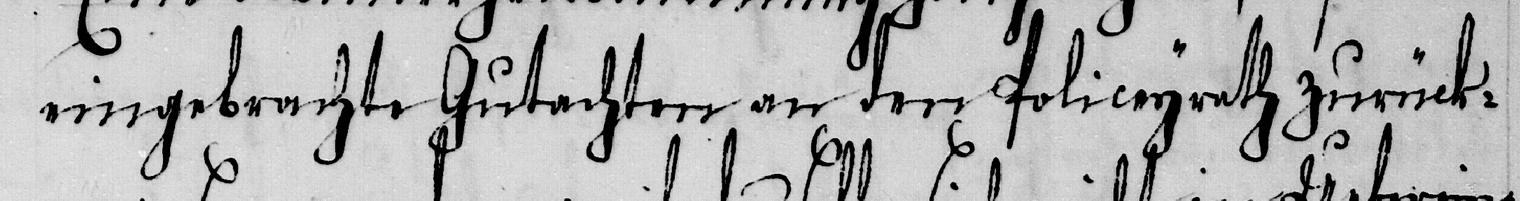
eingebrachte Gutachten an den Policeyrath zurück¬
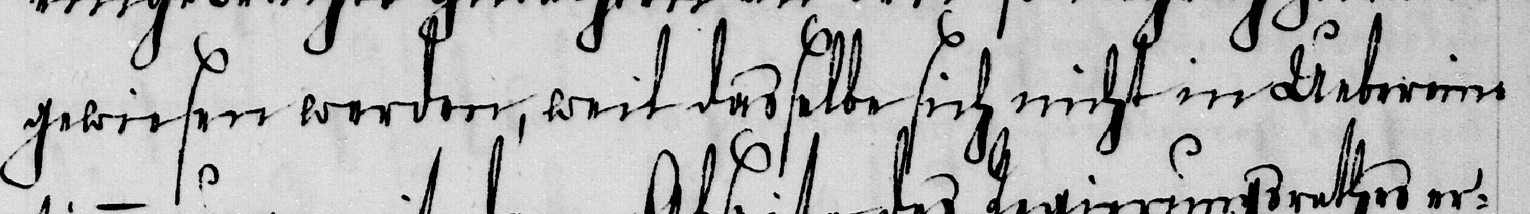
gewiesen werden, weil dasselbe sich nicht in Ueberein¬
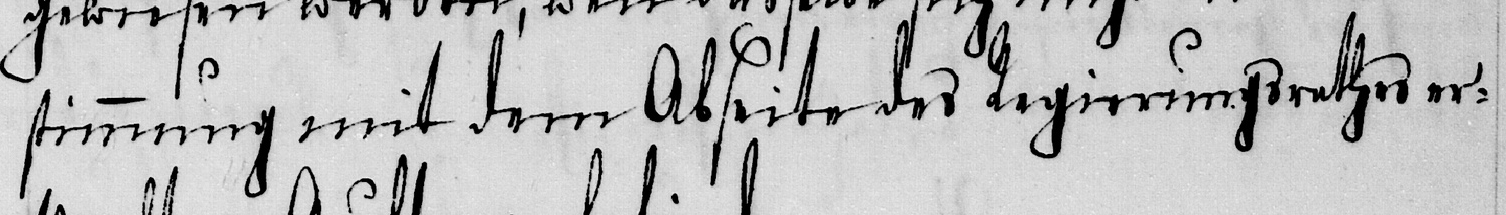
stimmung mit dem Abseite des Regierungsrathes er¬
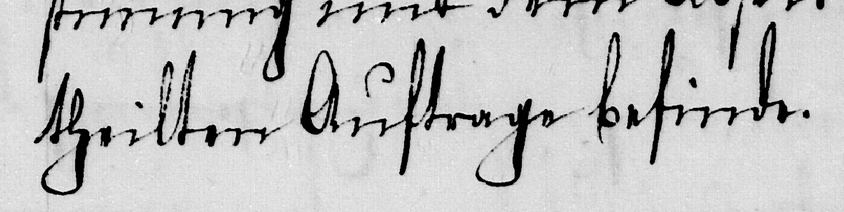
theilten Auftrage befinde.
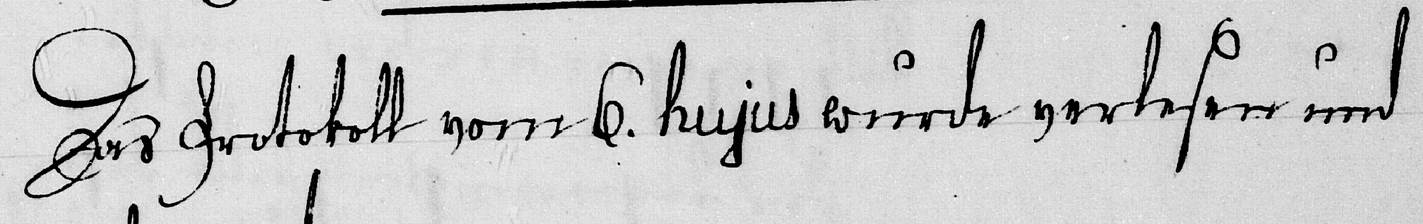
Das Protokoll vom 6. hujus wurde verlesen und
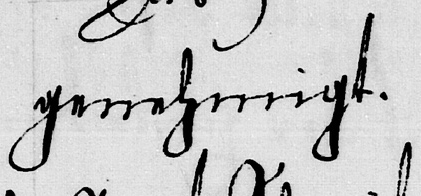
genehmigt.
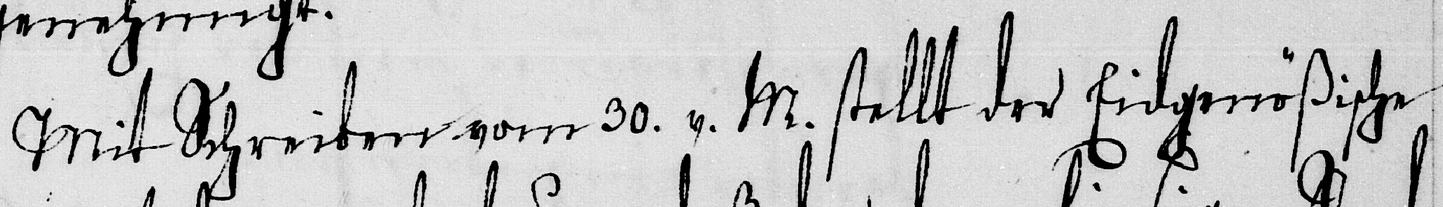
Mit Schreinen vom 30. v. M. stellt der Eidgenößische
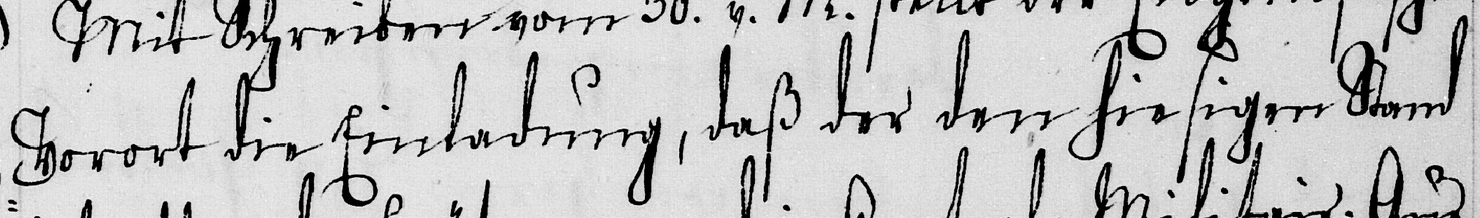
Vorort die Einladung, daß der den hiesigen Stand
